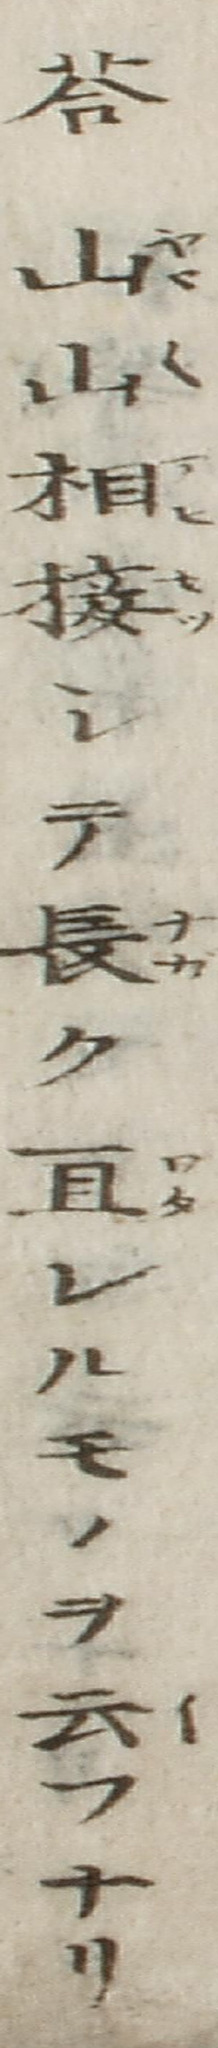答山山相接シテ長ク亘レルモノヲ云フナリ
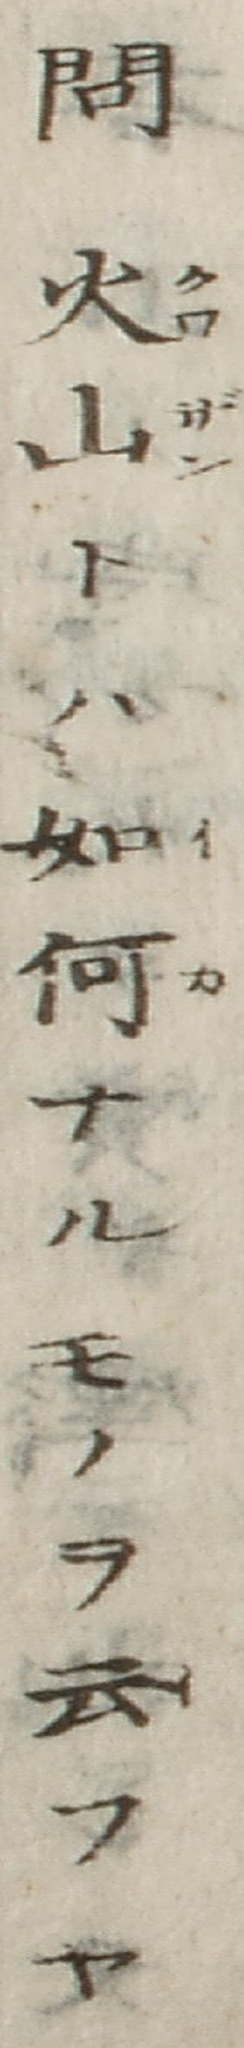問火山トハ如何ナルモノヲ云フヤ

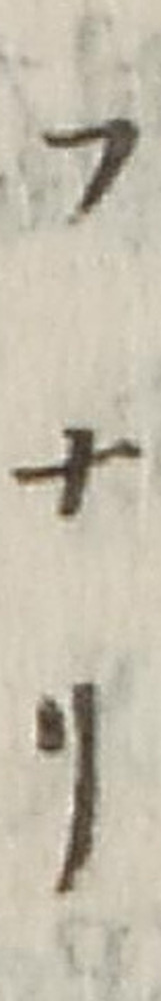フナリ

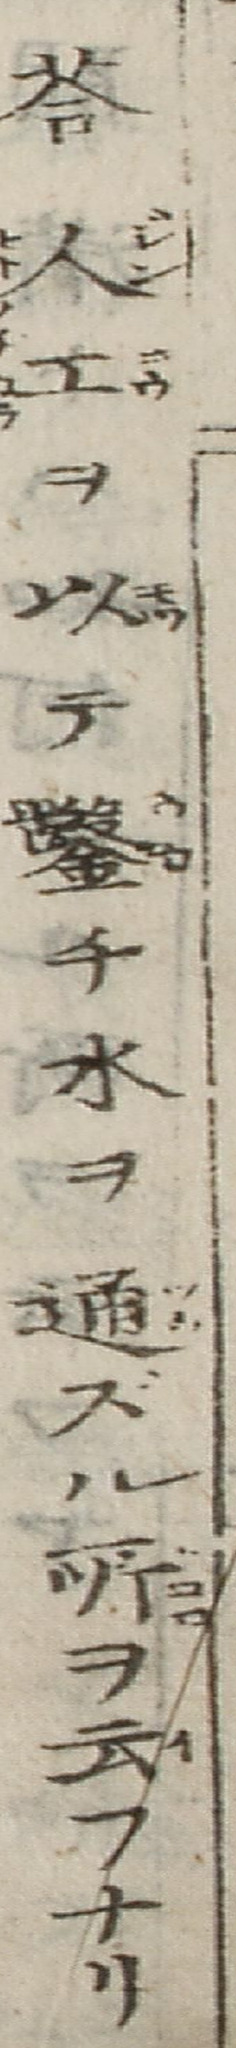答人工ヲ以テ鑿チ水ヲ通ズル所ヲ云フナリ
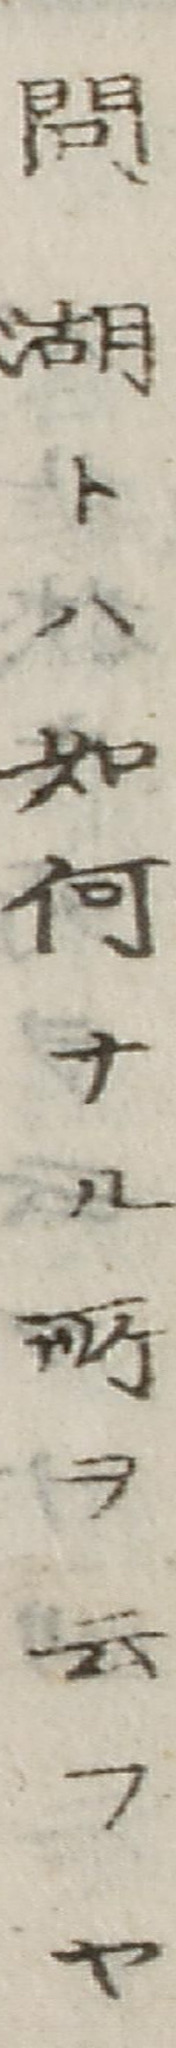問湖トハ如何ナル所ヲ云フヤ
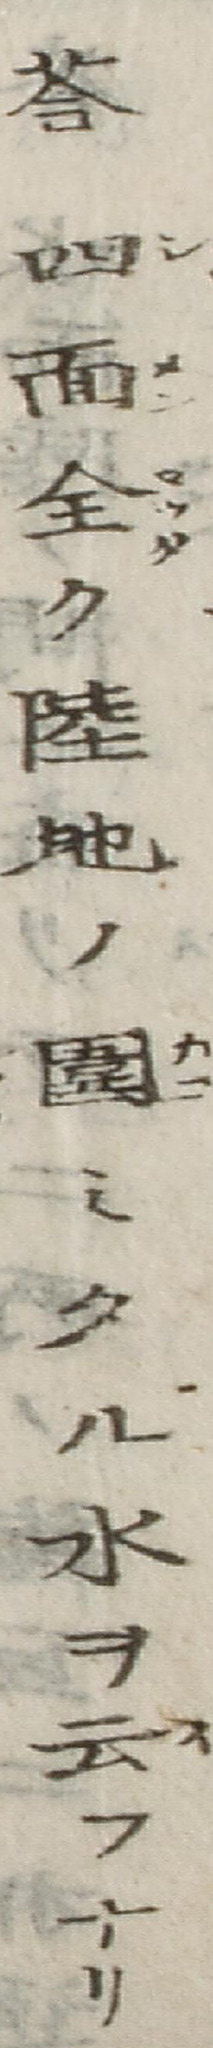答四面全ク陸地の圍ミタル水ヲ云フナリ
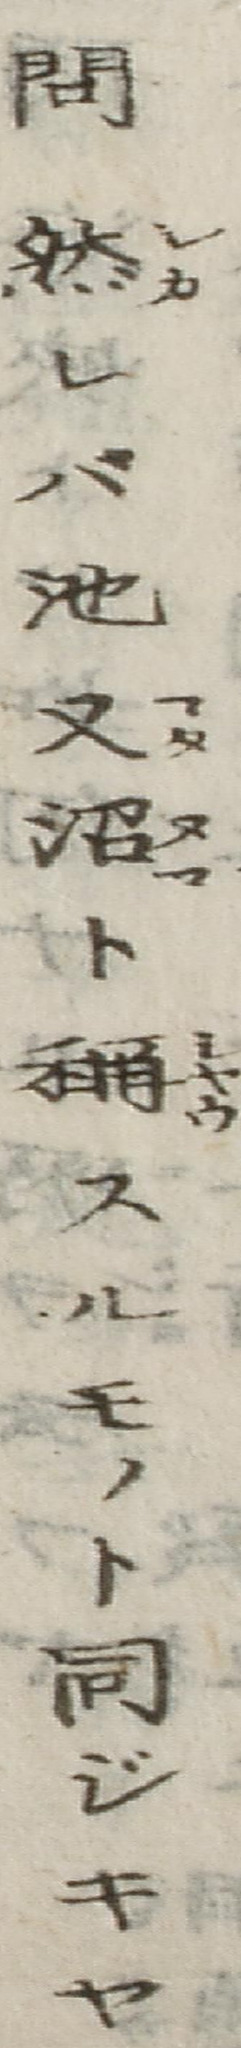問然レバ池又沼ト稱スルモノト同ジキヤ
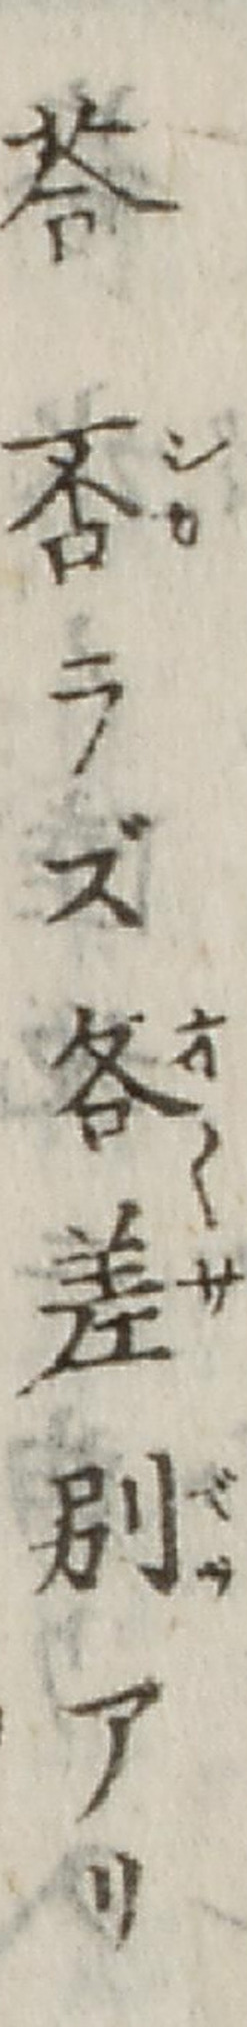答否ラズ各差別アリ
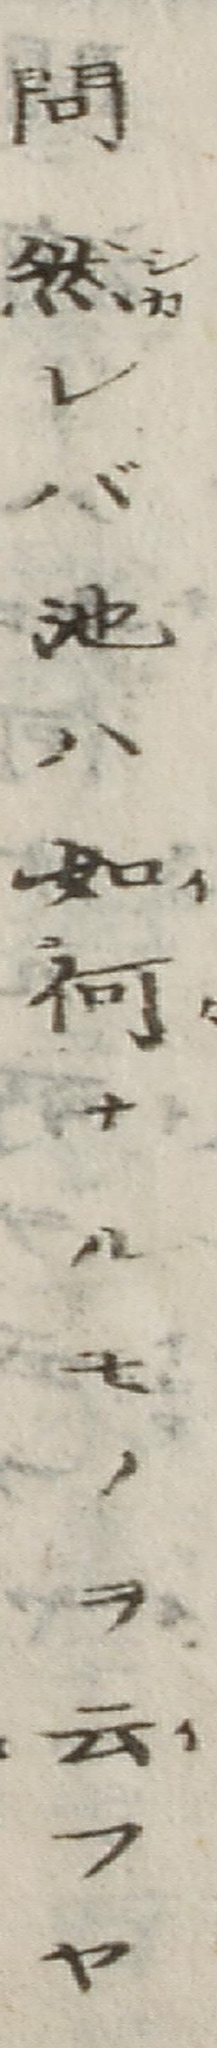問然レバ池ハ如何ナルモノヲ云フヤ
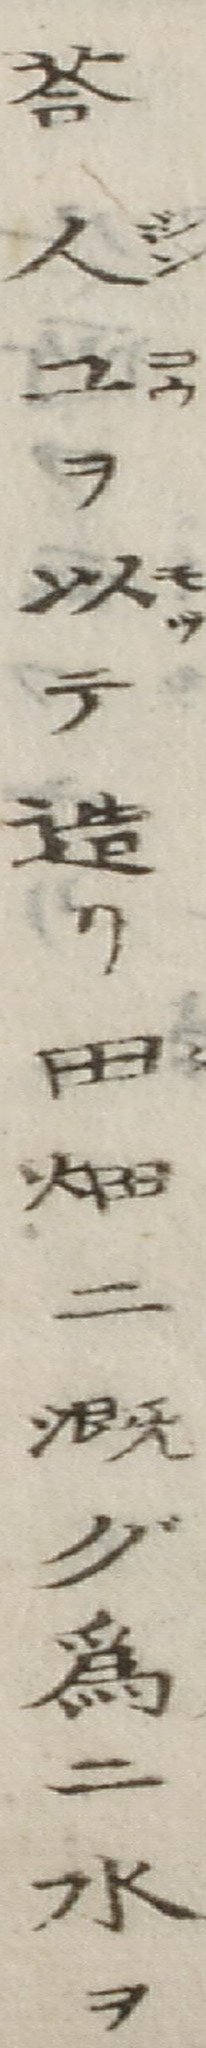答人工ヲ以テ造リ田畑ニ漑グ為ニ水ヲ
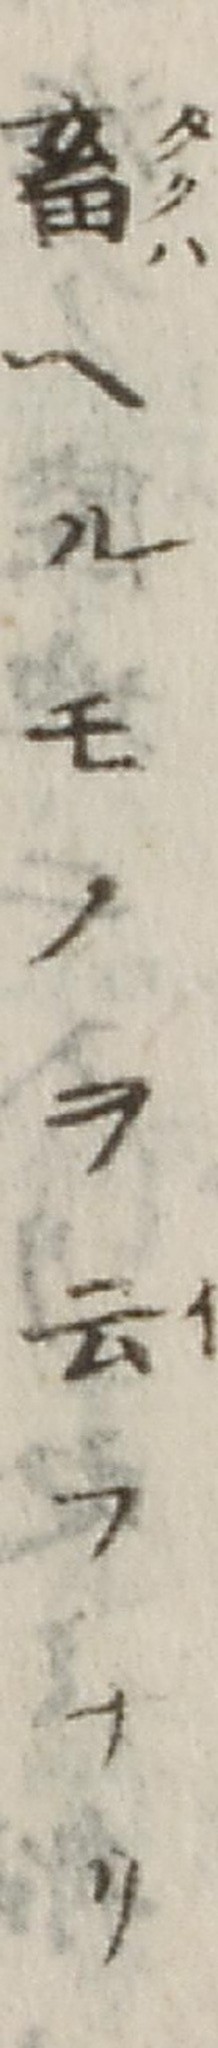蓄ヘルモノヲ云フナリ
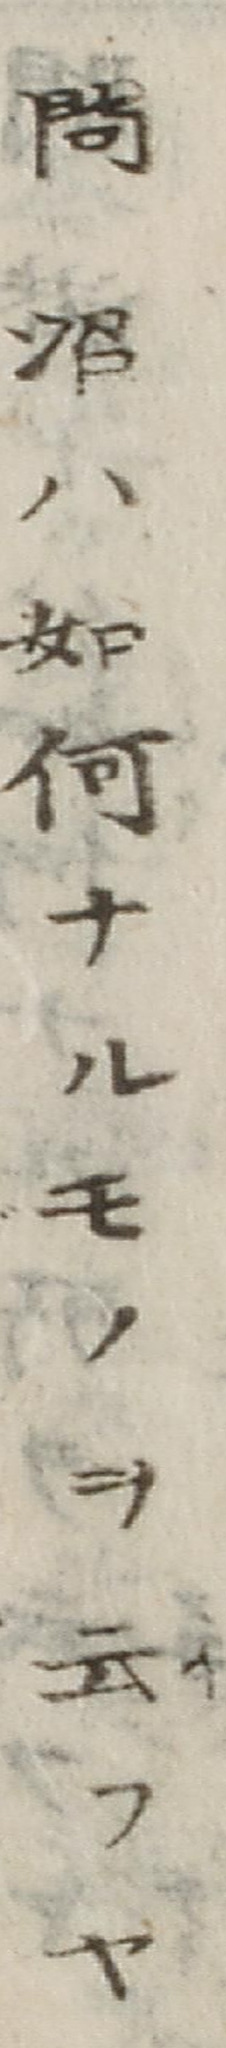問沼ハ如何ナルモノヲ云フヤ
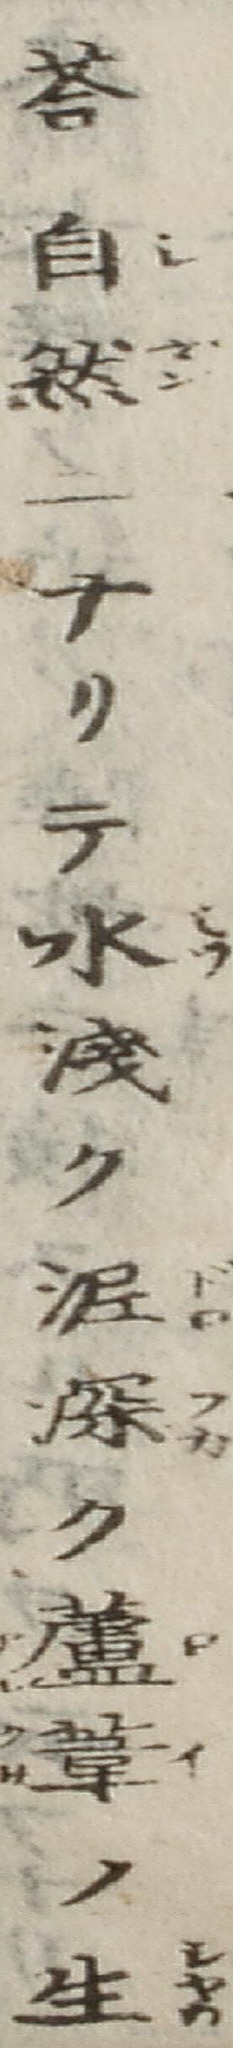答自然ニナリテ水浅ク泥深ク蘆葦ノ生
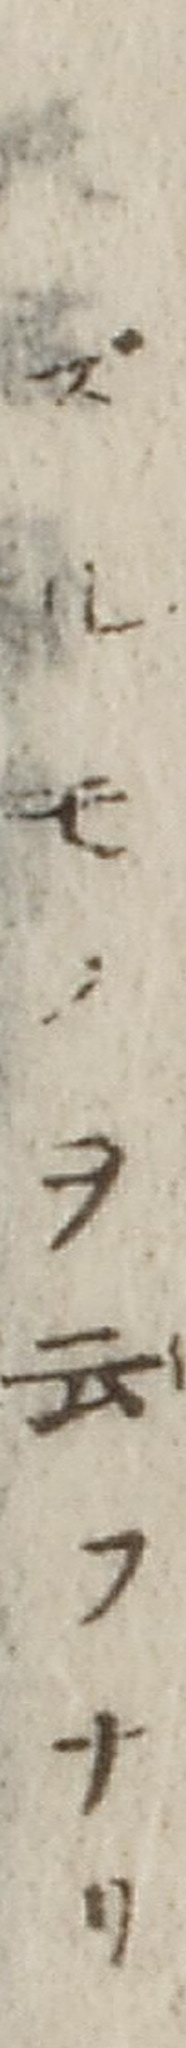ズルモノヲ云フナリ
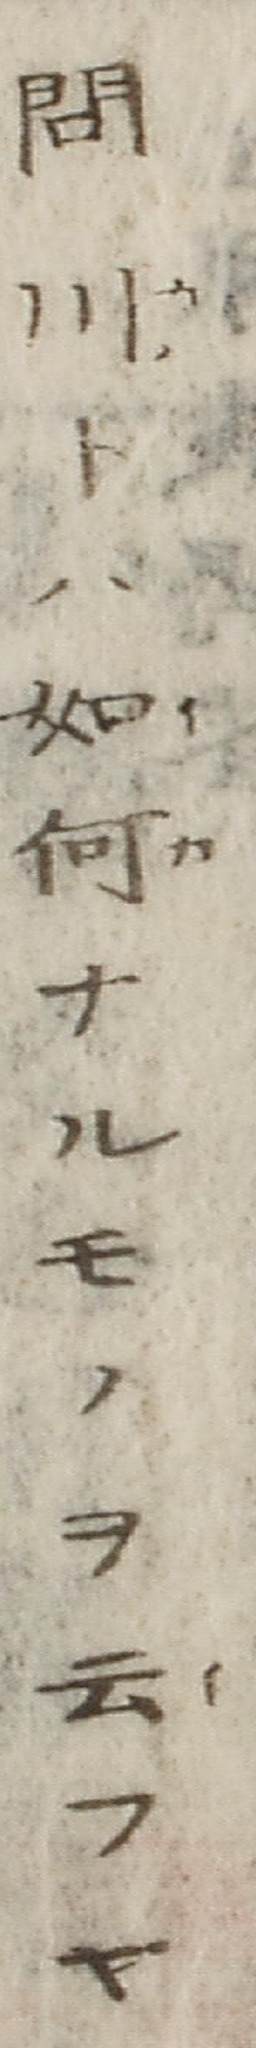問川トハ如何ナルモノヲ云フヤ
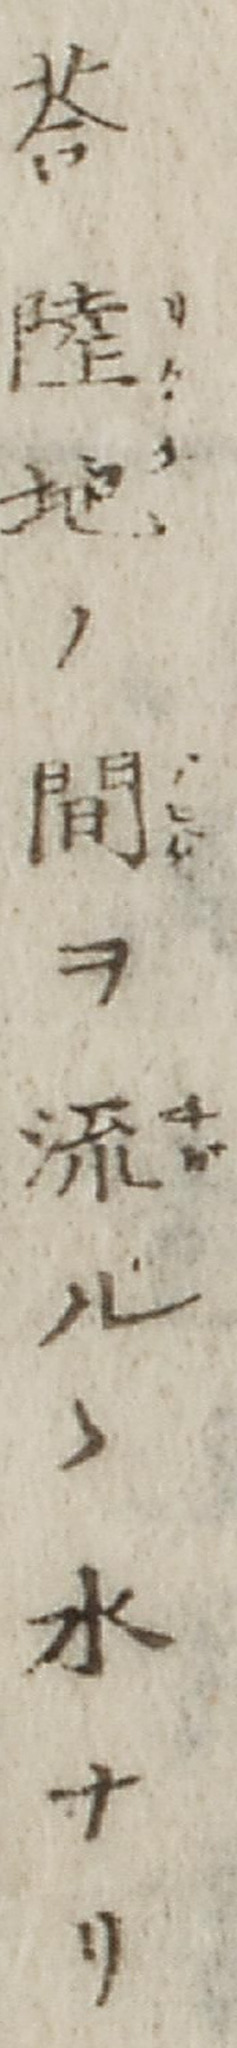答陸地ノ間を流ルヽ水ナリ
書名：地球儀問答　全
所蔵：東京大学地震研究所図書室 Earthquake Research Institute Library, The University of Tokyo, JAPAN
